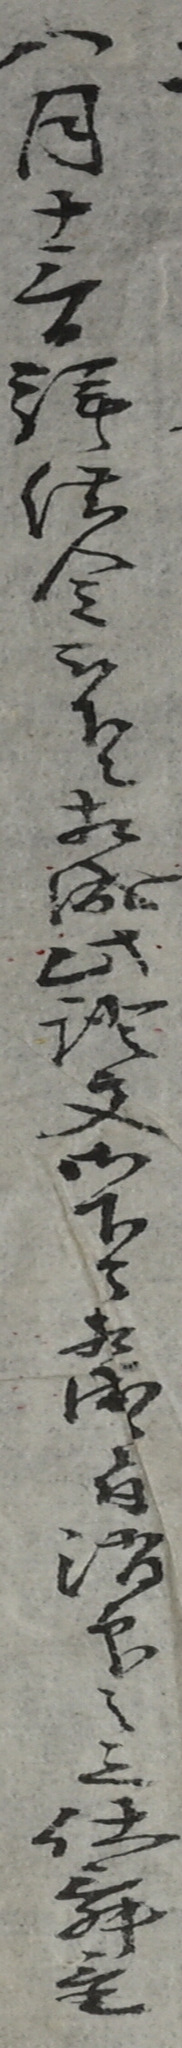八月十三日拝借金被下候相成此証文御下ヶ相成候ニ付消印之上仕舞置
